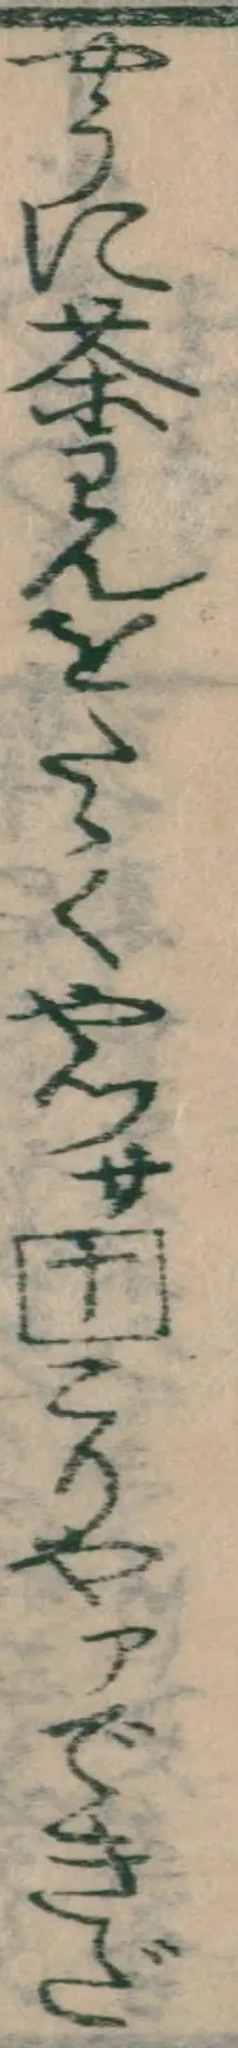やうに茶わんをたゝくやつサ〈十〉こりやァできだ
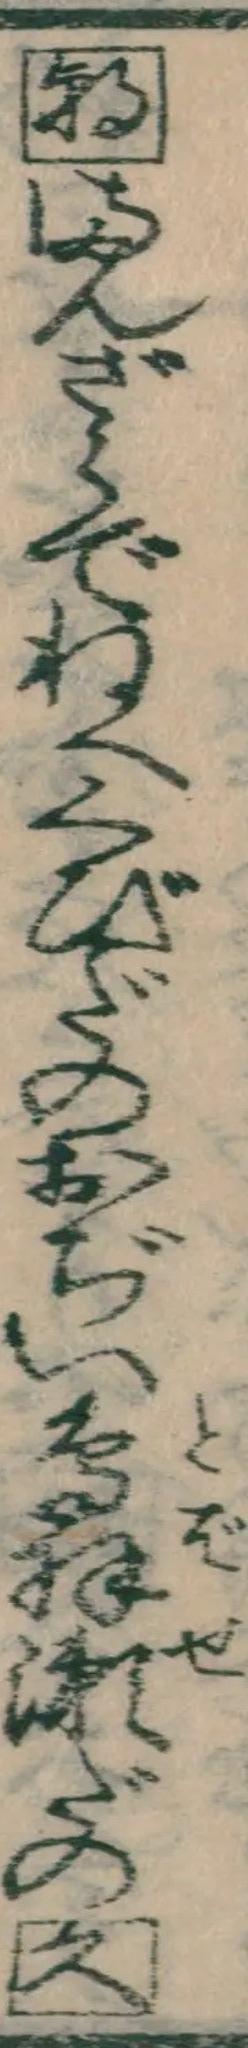〈朝〉まんざらでねへくびだのおぢい鳥羽瀬だの〈久〉
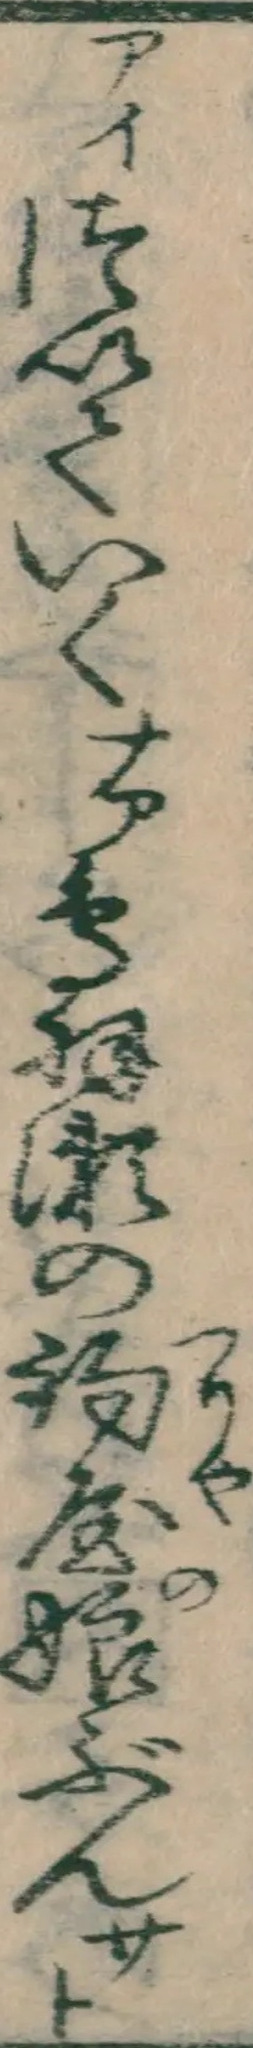アイついていくナア鳥羽瀬の釣屋の娘ぶんサト

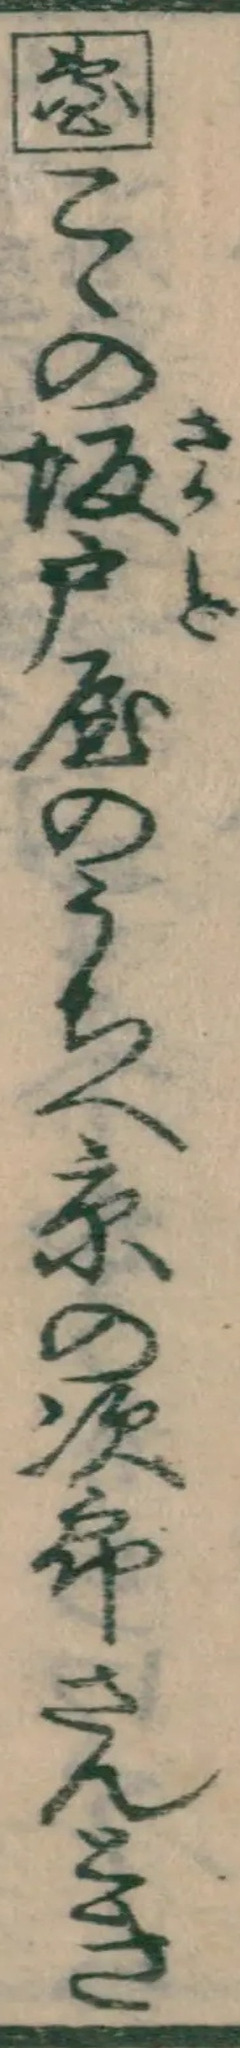〈団〉こゝの坂戸屋のうちへ京の次郎さんとき
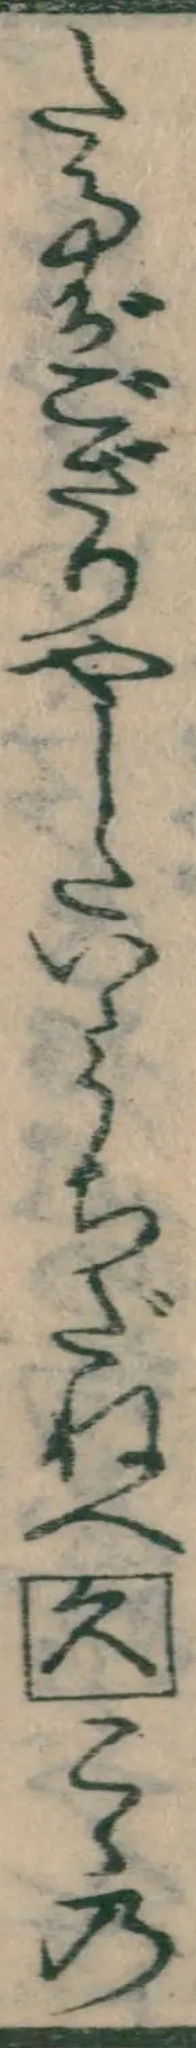た事がござりやしたいゝたうちだねへ〈久〉こゝの
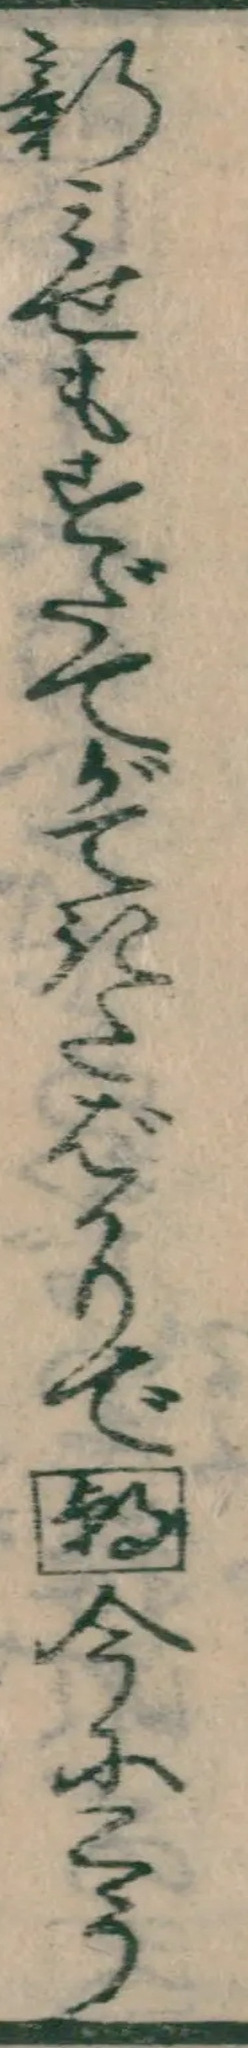新みせもすだてがてきたばかりで〈朝〉今にこう
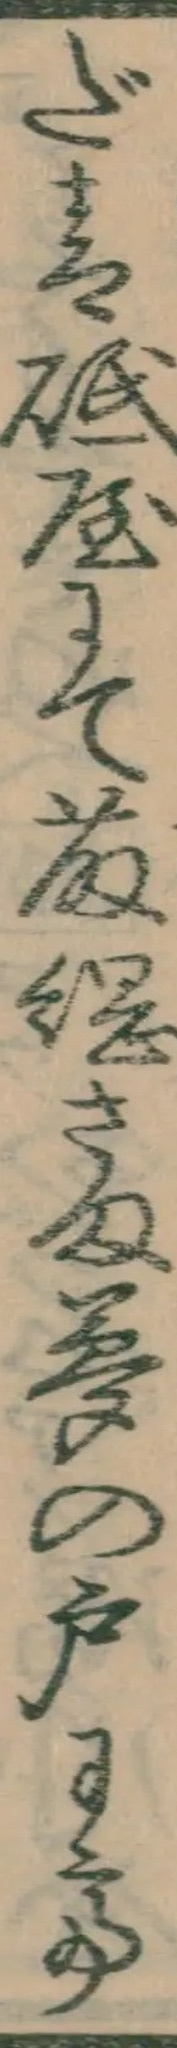だ青砥屋にて藤綱さま夢の戸にて
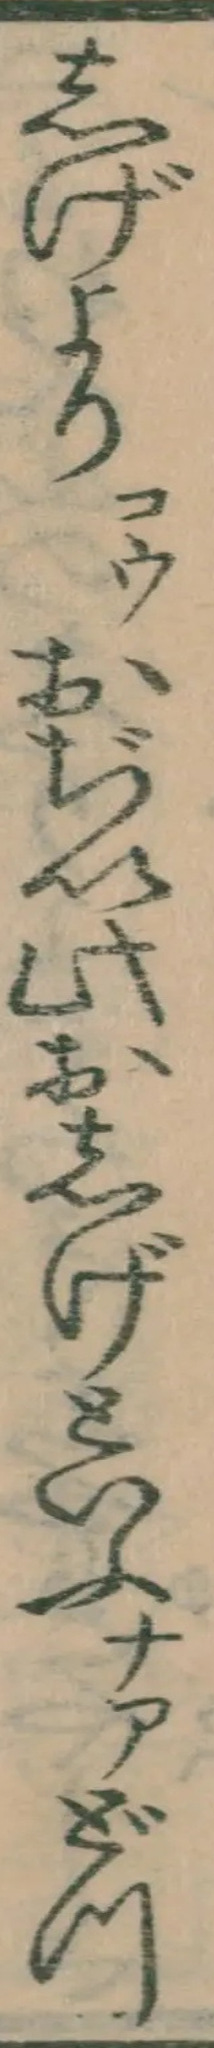しげよりコウおぢい此おしげといふナアどつ
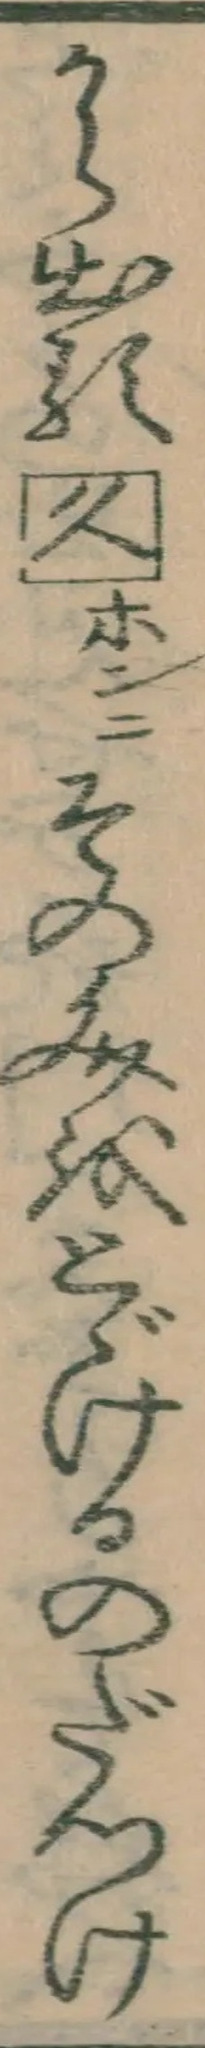から出る〈久〉ホンニその文をとゞけるのだつけ
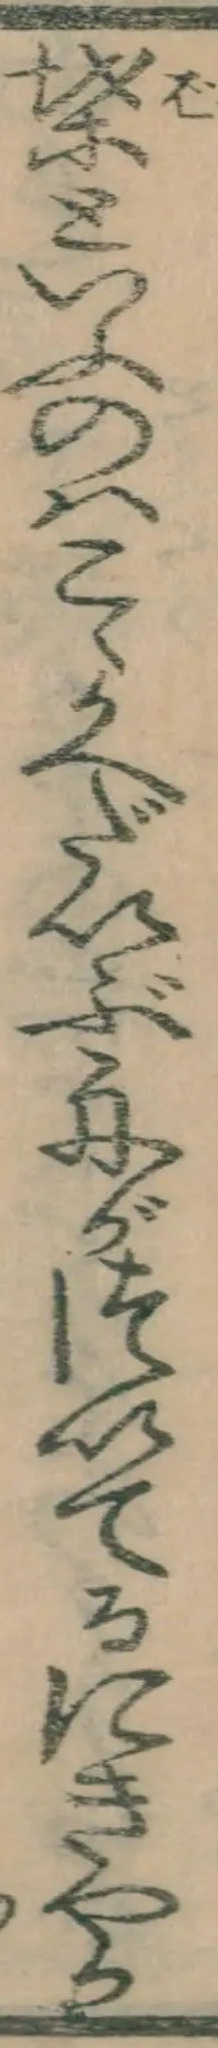葉といふのはこゝかへだいぶ舟がついてるにきやか
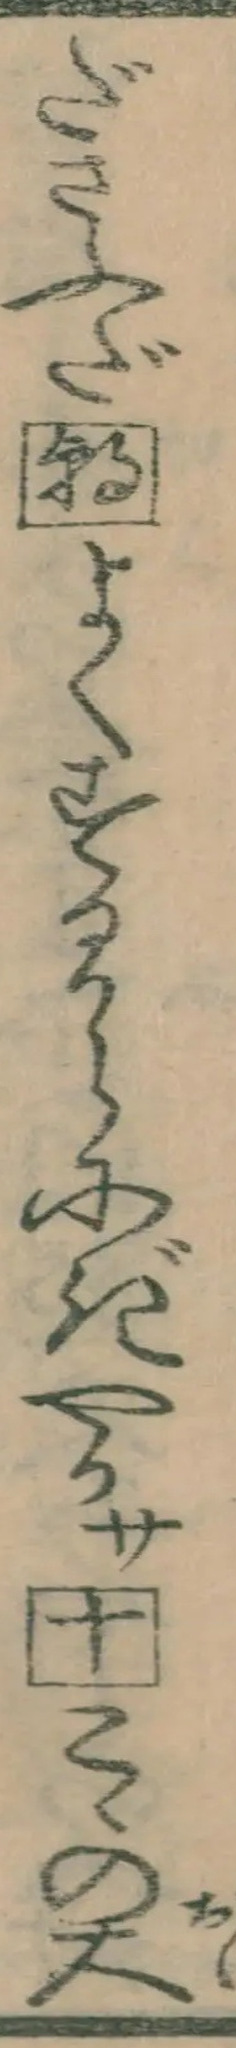ださふだ〈朝〉よくするからにぎやかサ〈十〉こゝの大

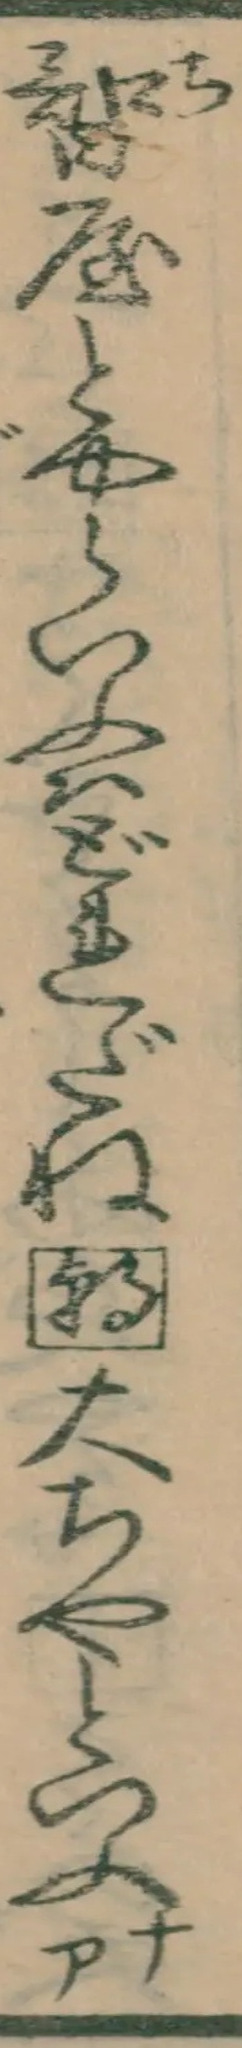智屋とやらいふはどれだね〈朝〉大ちやといふナア
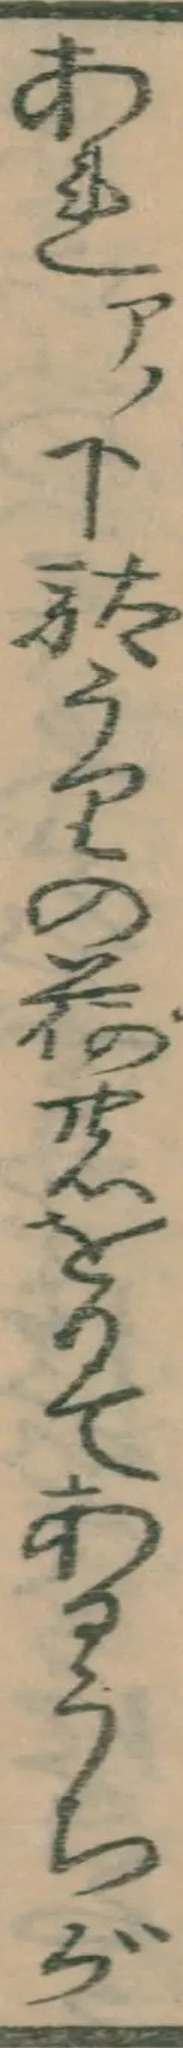あれアノ下駄うりの荷のをりてあるうちが
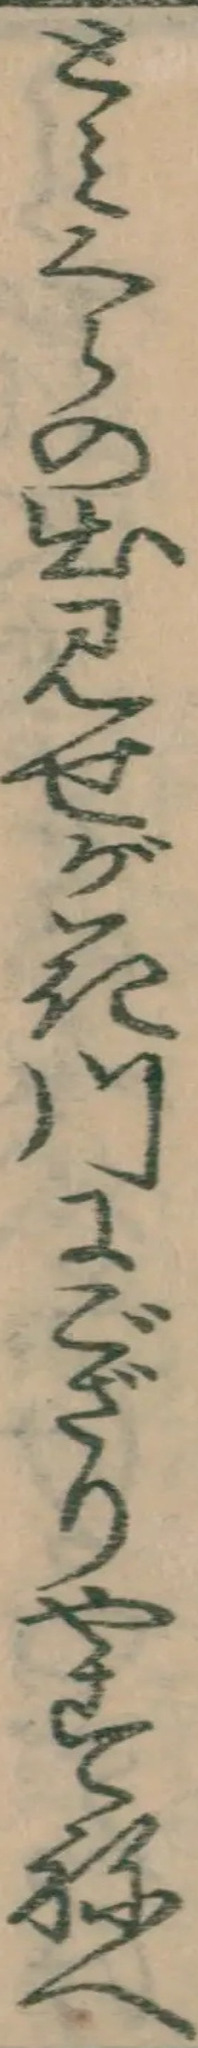とみくらの出見せが花川にござりやすねへ
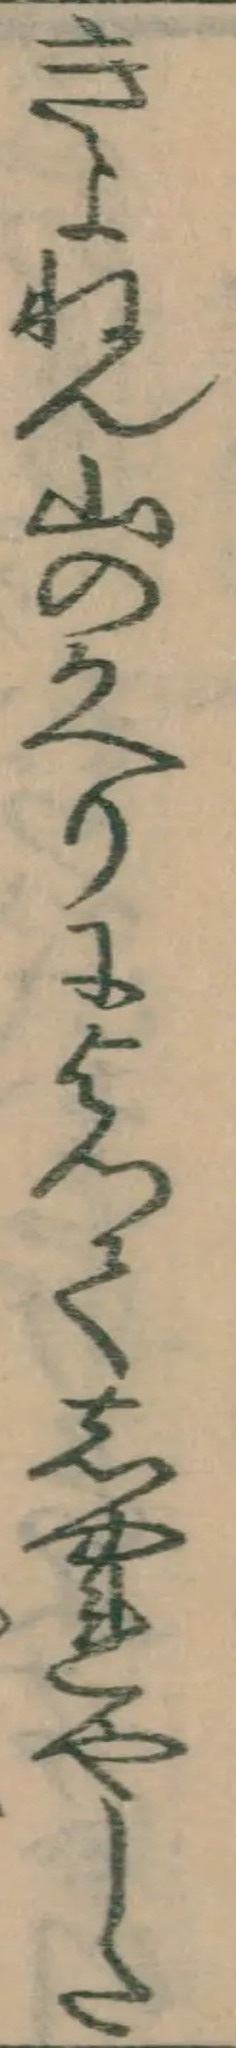きよねん山のかへりによつてしやれやした
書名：教訓読本：大礒風俗仕懸文庫
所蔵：国立国会図書館 National Diet Library, JAPAN
